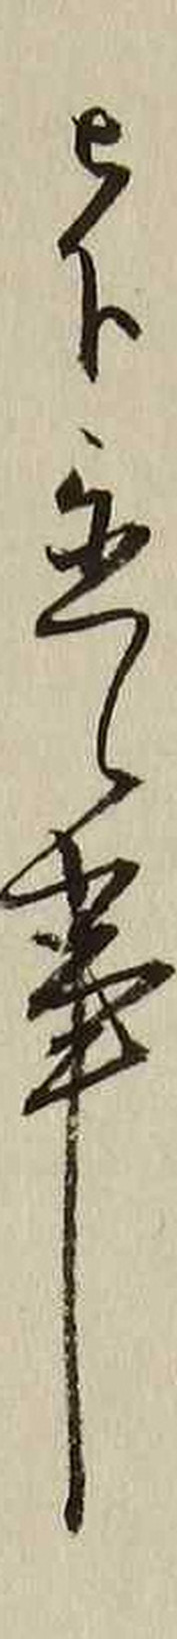被下置候事
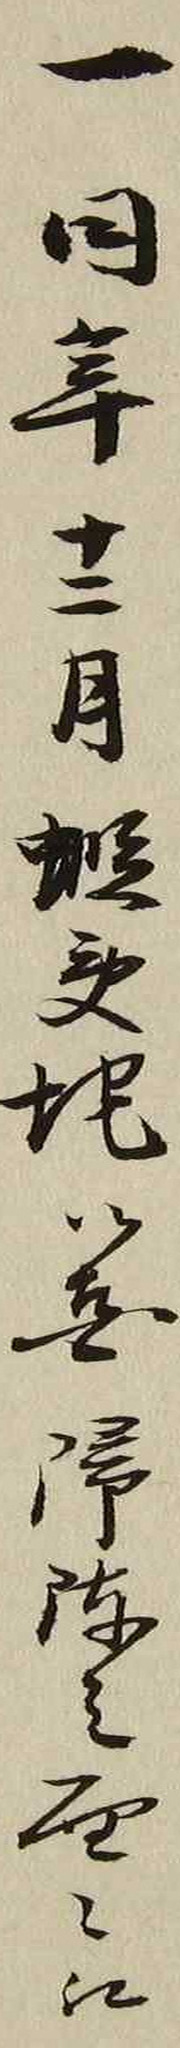一同年十二月蝦夷地御固帰陣之面々江
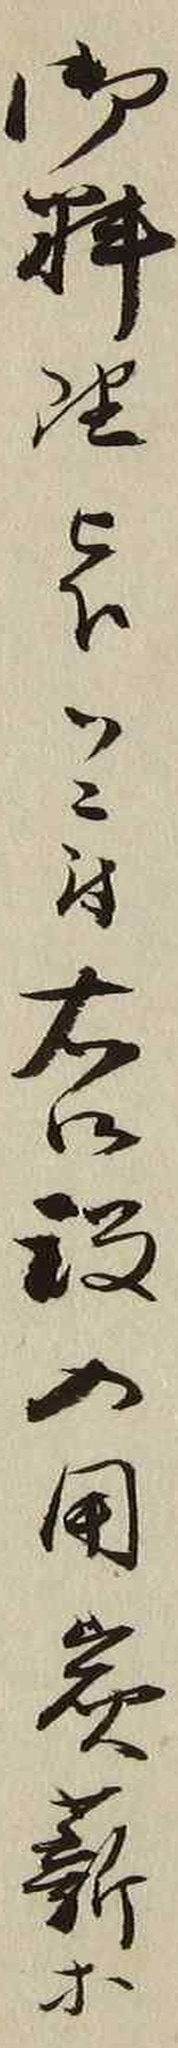御料理被下候ニ付右御役入用炭薪等
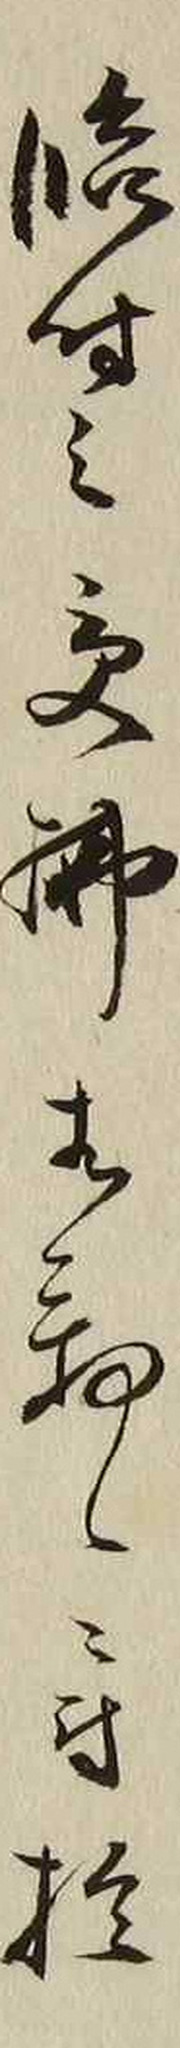臨時之受払相勤候ニ付於
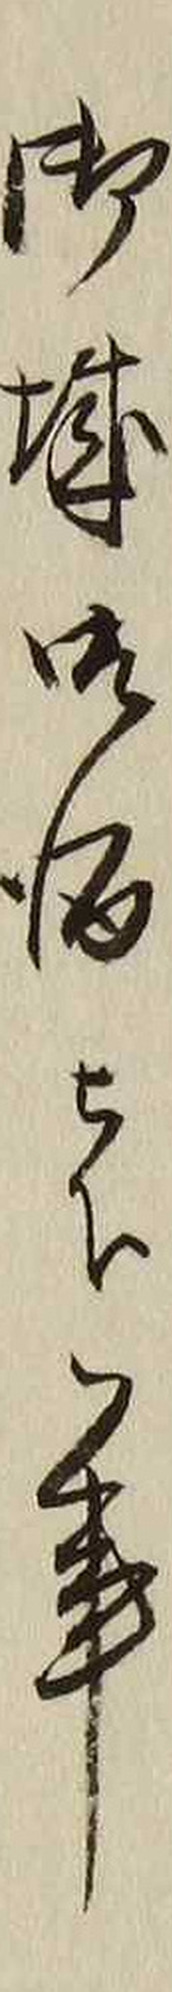御城御酒被下置候事
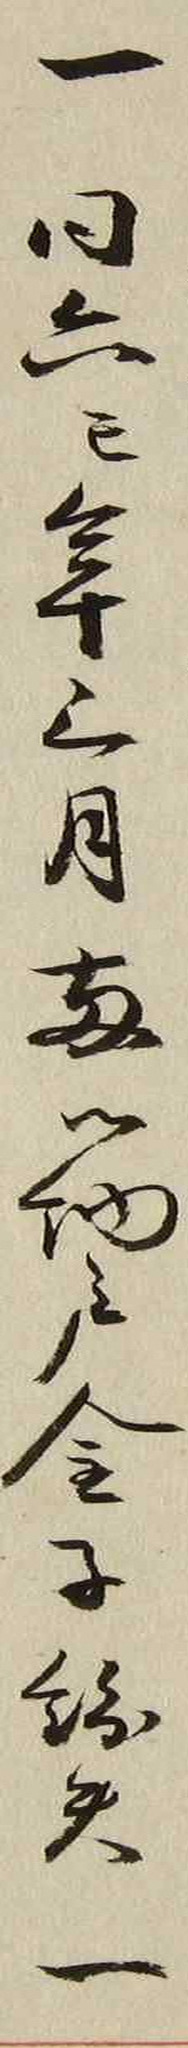一同六巳年三月両御納戸金子紛失一
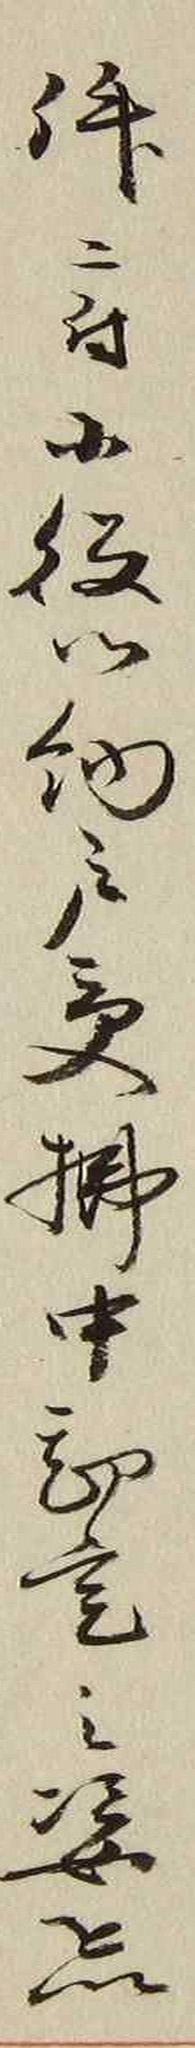件二付小役御納戸受払中勘定之姿を以
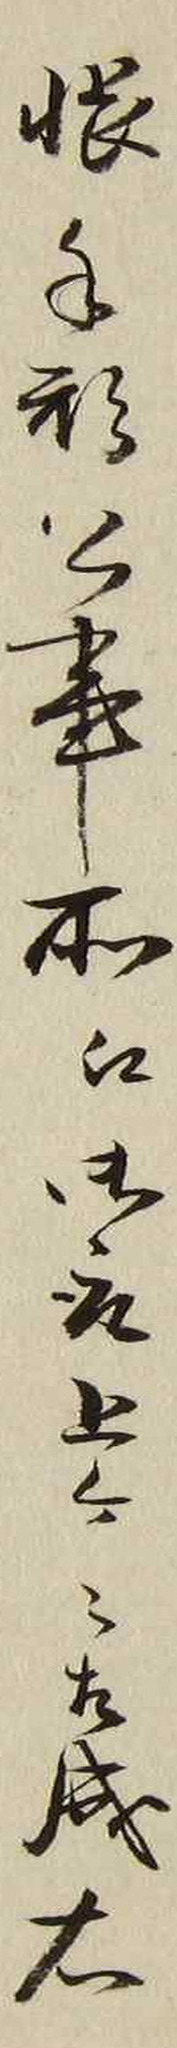帳手形公事所江御取上ヶニ相成右
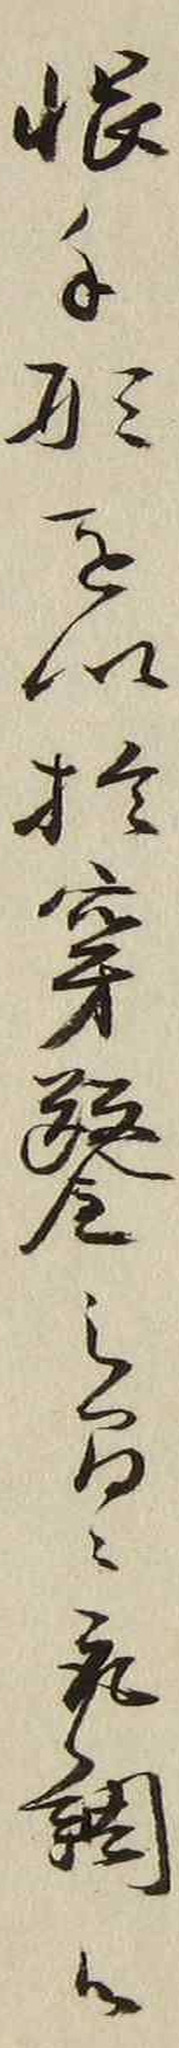帳手形を以於穿鑿之間ニ取調候
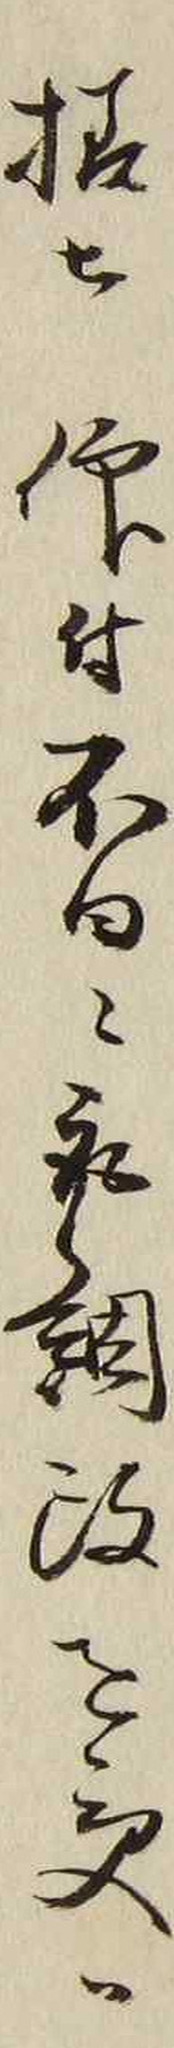様被仰付不日ニ取調改を受候

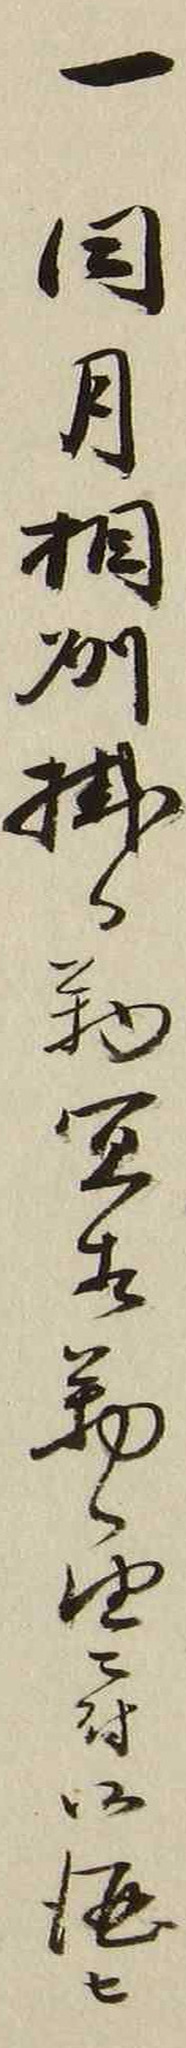一同月相州掛り勤宜相勤候由ニ付御酒被
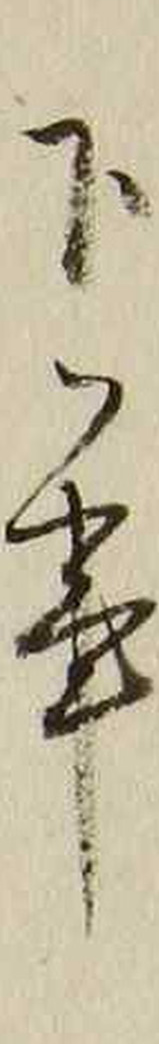下候事
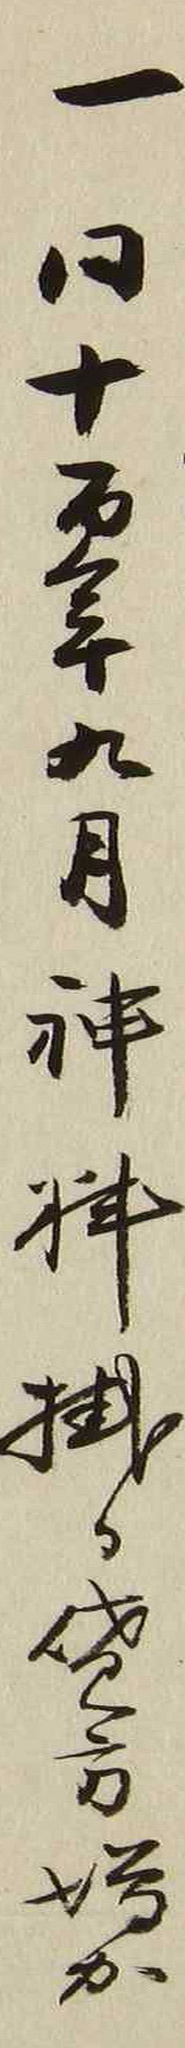一同十酉年九月神料掛り貸方増加
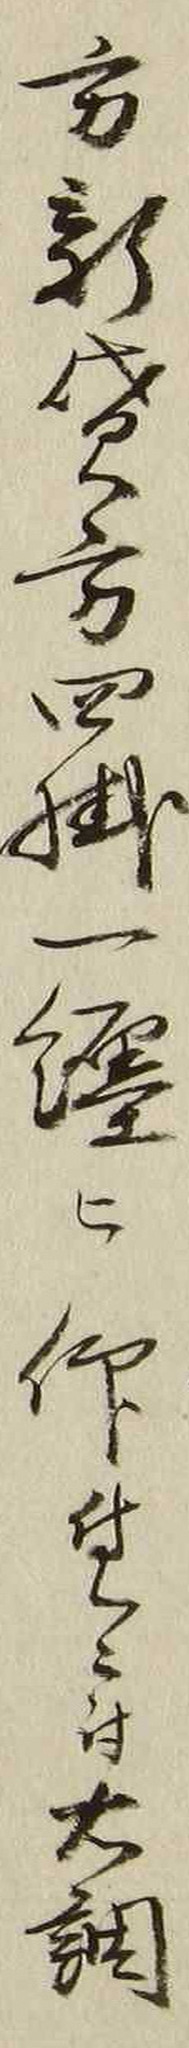方新貸方四掛一纏被仰付候ニ付右調
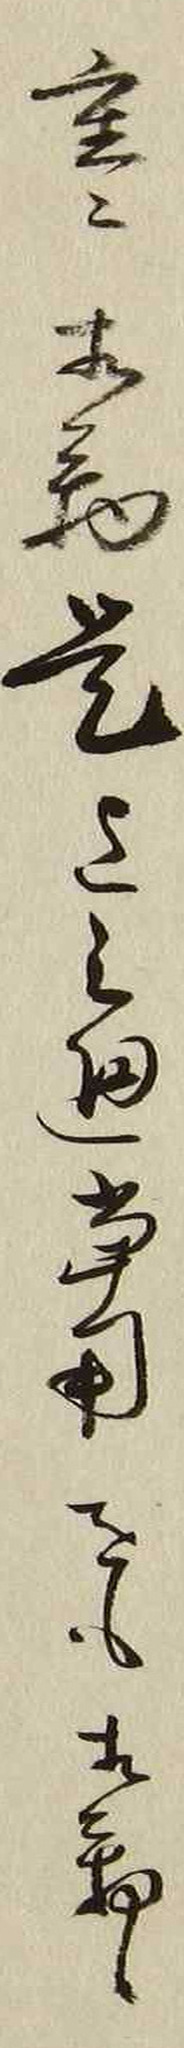重ニ相勤是迄之通当用をも相勤候
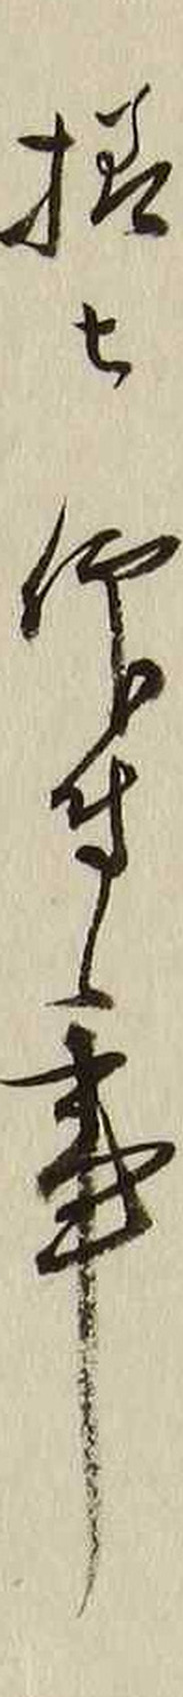様被仰付候事
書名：諸士系譜　巻之291　さ之部23
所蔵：会津若松市立会津図書館
